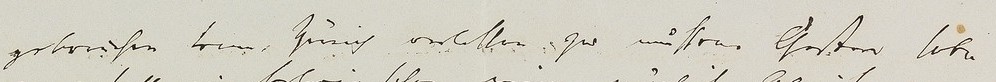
gebrauchen kann, Zürich verlassen zu müssen. Gestern habe
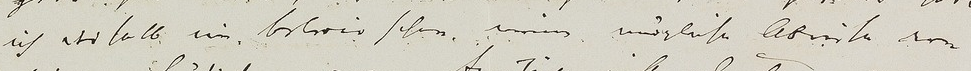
ich deshalb im Belvoir schon meine mögliche Abreise von
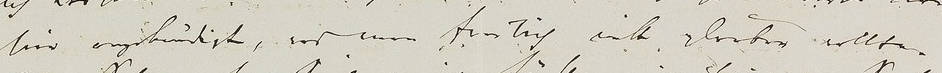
hier angekündigt, was man freilich nicht glauben wollte.
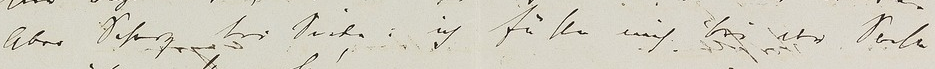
Aber Scherz bei Seite: ich fühle mich bei der Sache
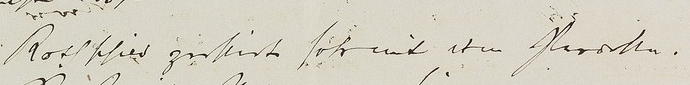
Rothschild pressirt sehr mit dem Parcellen.
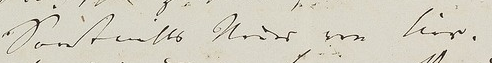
Sonst nichts Neues von hier.
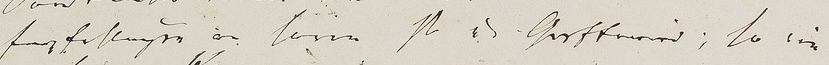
Empfehlungen an Herrn P u. Graffenried; So wie
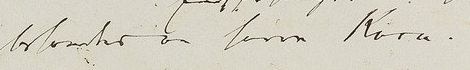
besonders an Herrn Kern.
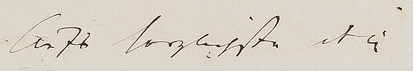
Aufs herzlichste dein
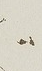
den 13.
